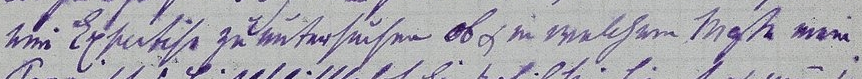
eine Expertise zu untersuchen ob & in welchem Maße mein
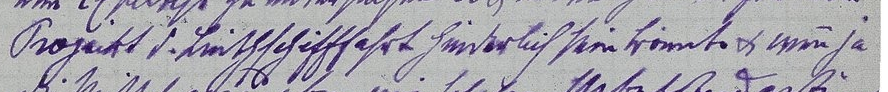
Projekt d. Linthschifffahrt hinderlich sein könnte & wenn ja
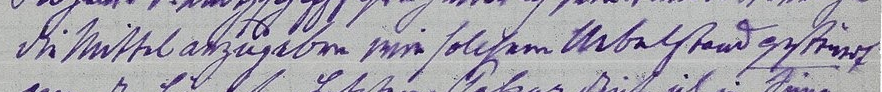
die Mittel anzugeben wie solchem Uebelstand gesteuert
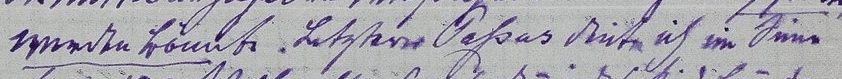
werden könnte. Letzteren Passus deute ich im Sinne
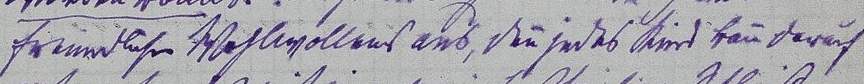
freundlichen Wohlwollens aus, denn jedes Kind kann darauf
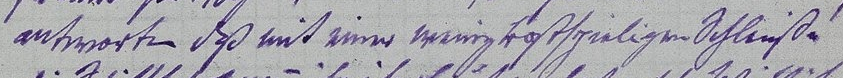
antworten daß mit einer wenig kostspieligen Schleuße
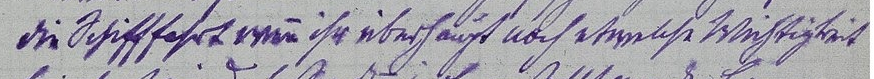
die Schifffahrt wenn ihr überhaupt noch etwelche Wichtigkeit
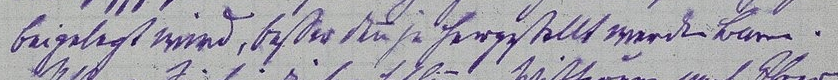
beigelegt wird, besser denn je hergestellt werden kann.
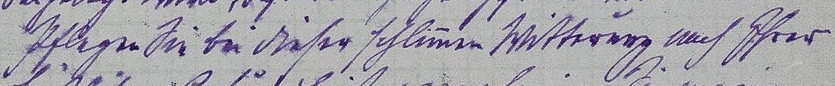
Pflegen Sie bei dieser schlimmen Witterung nach Ihrer
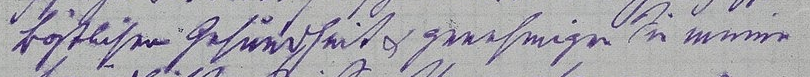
köstlichen Gesundheit & genehmigen Sie meine
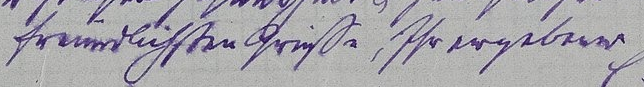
freundlichsten Grüße, Ihr ergebener
